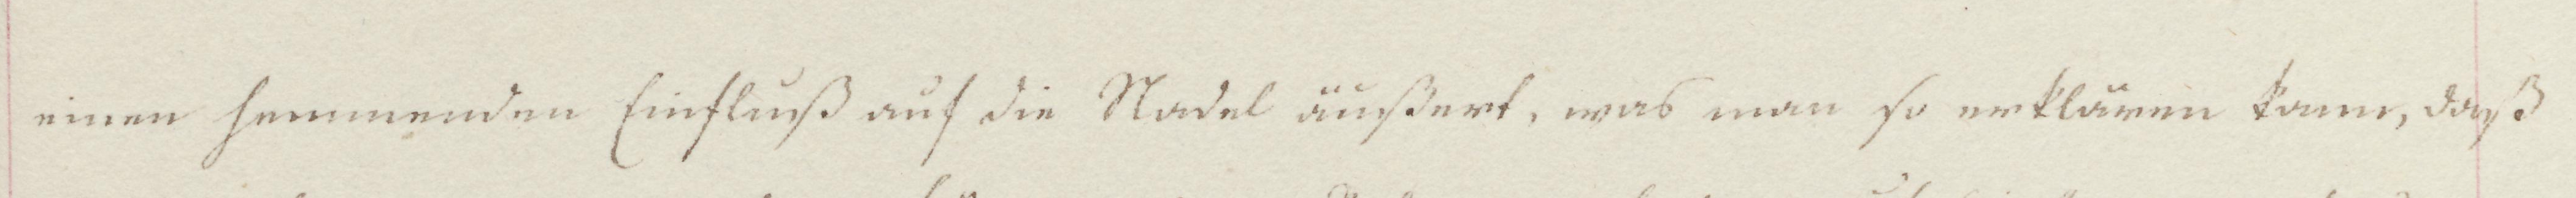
einen hemmenden Einfluß auf die Nadel äußert, was man so erklären kann, daß
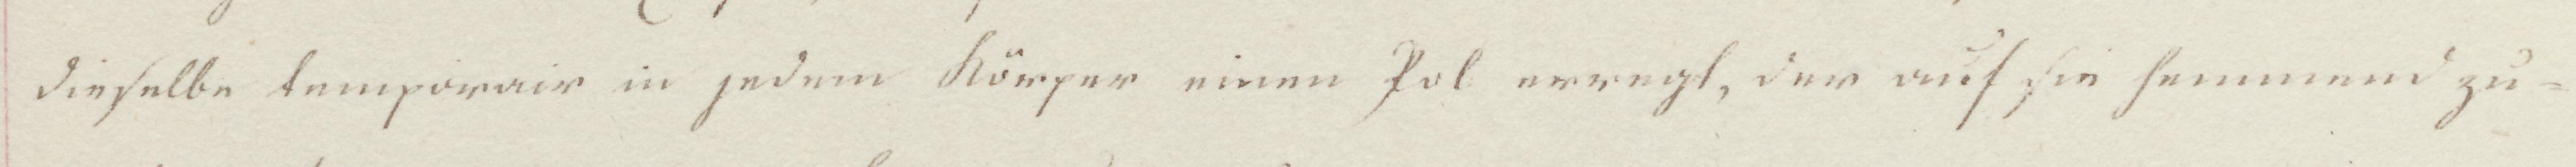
dieselbe temporär in jedem Körper einen Pol erzeugt, der auf sie hemmend zu-
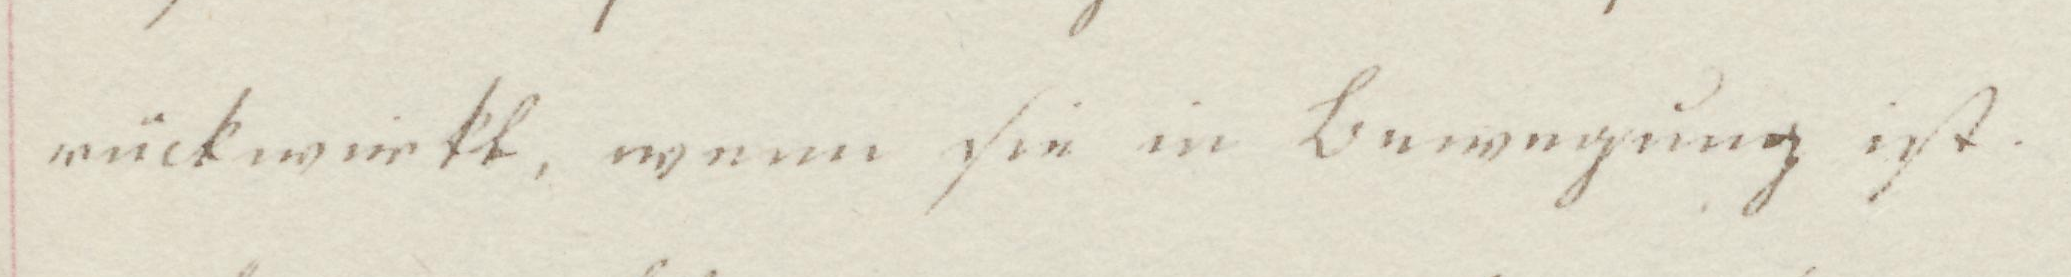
rückwirkt, wenn sie in Bewegung ist.
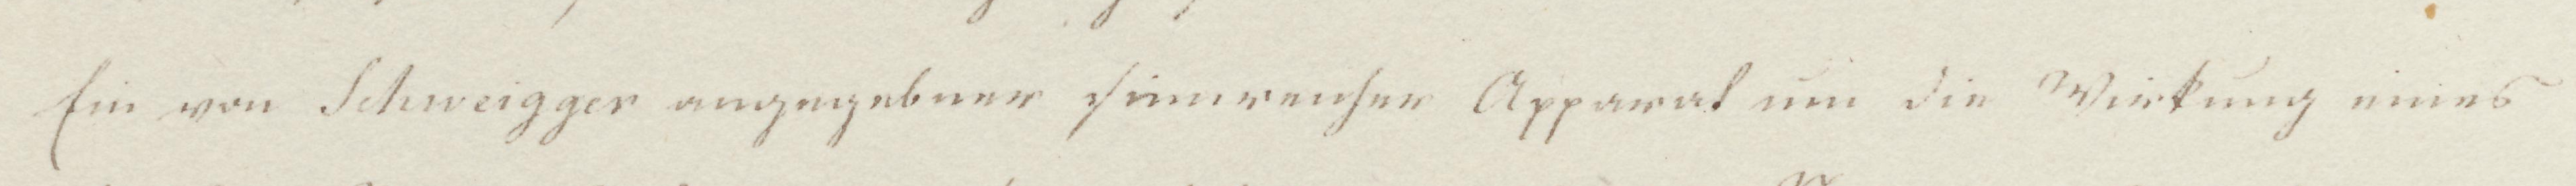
Ein von Schweigger angegebner sinnreicher Apparat um die Wirkung eines
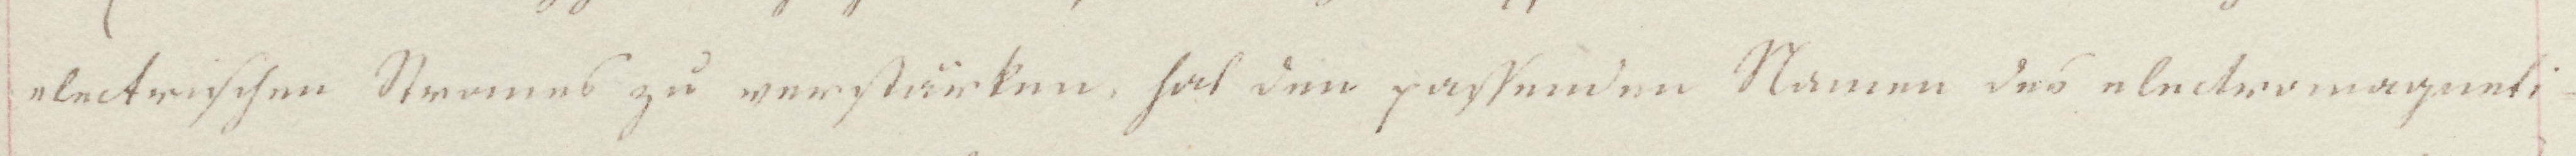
electrischen Stromes zu verstärken, hat den passenden Namen des electromagneti-
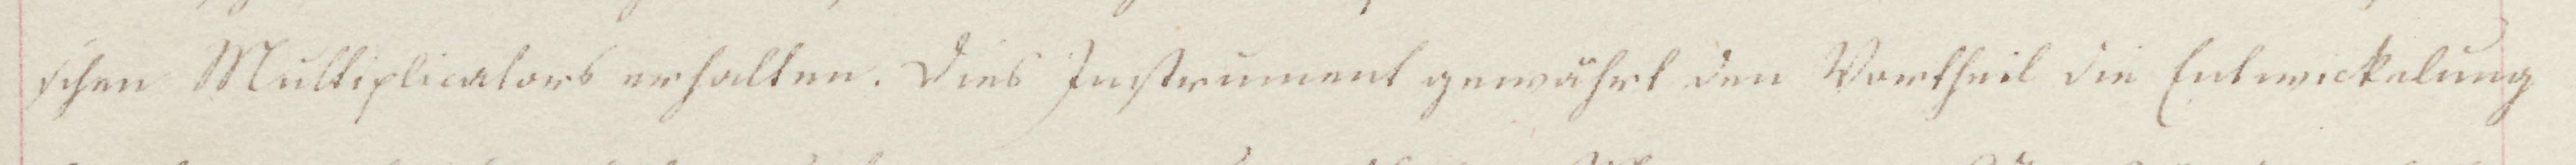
schen Multiplicators erhalten. Dies Instrument gewährt den Vortheil die Entwickelung
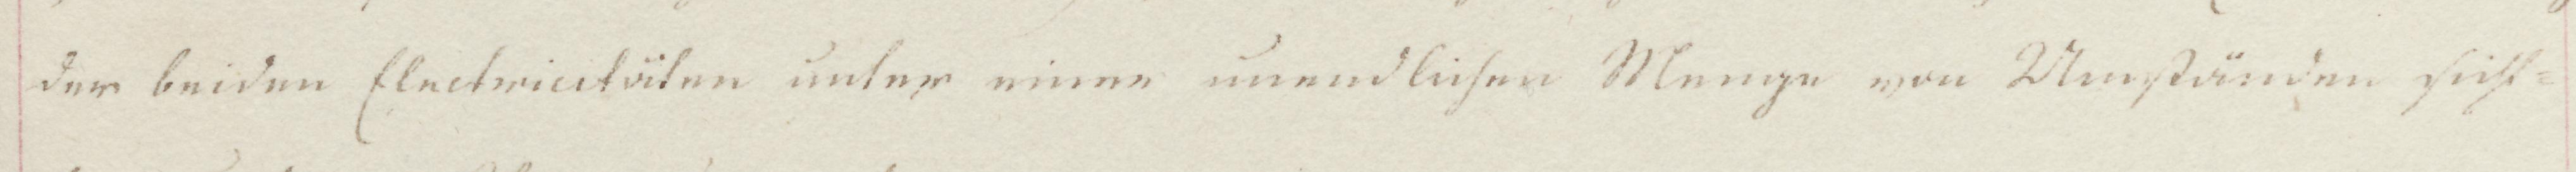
der beiden Electricitäten unter einer unendlichen Menge von Umständen sicht-
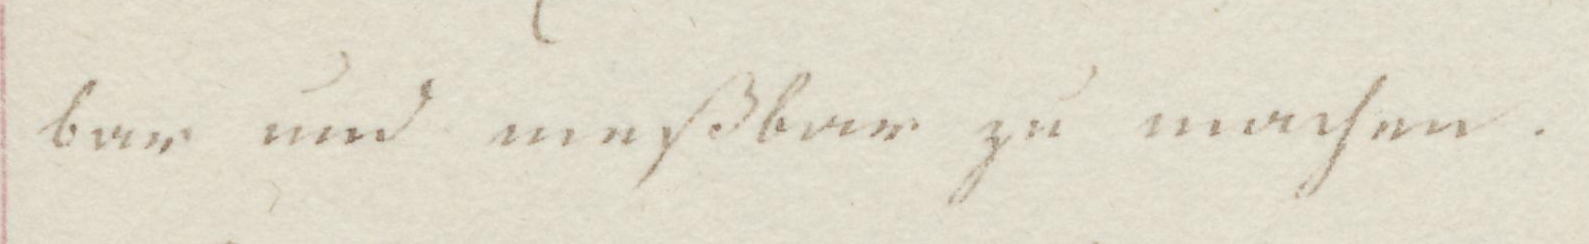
bar und meßbar zu machen.
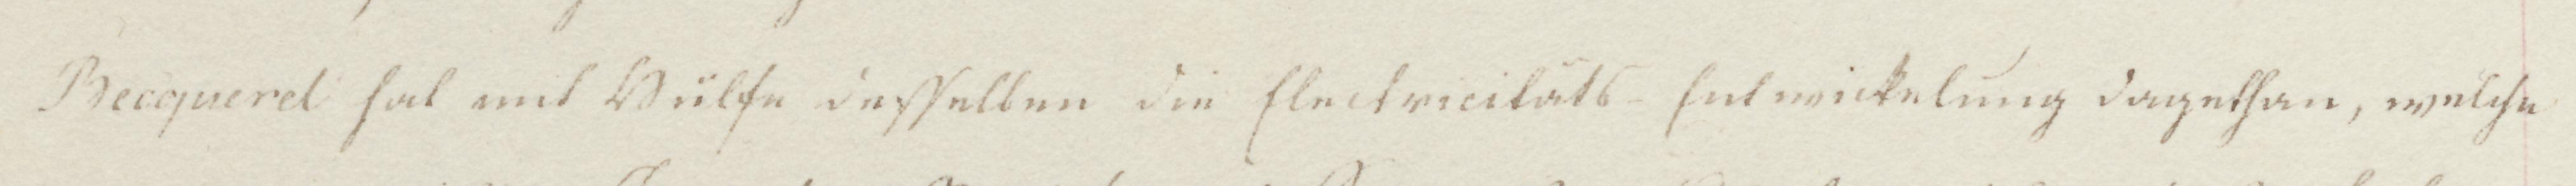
Becquerel hat mit Hülfe desselben die Electricitäts-Entwickelung dargethan, welche
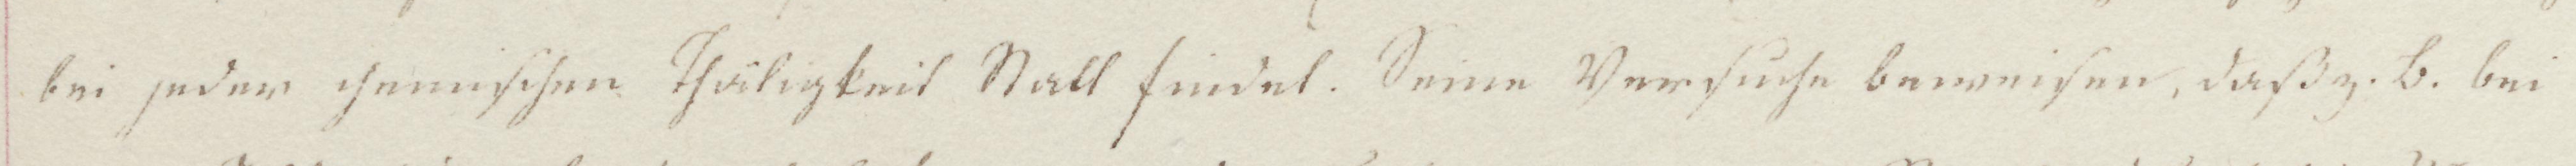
bei jeder chemischen Thätigkeit Statt findet. Seine Versuche beweisen, daß z. B. bei
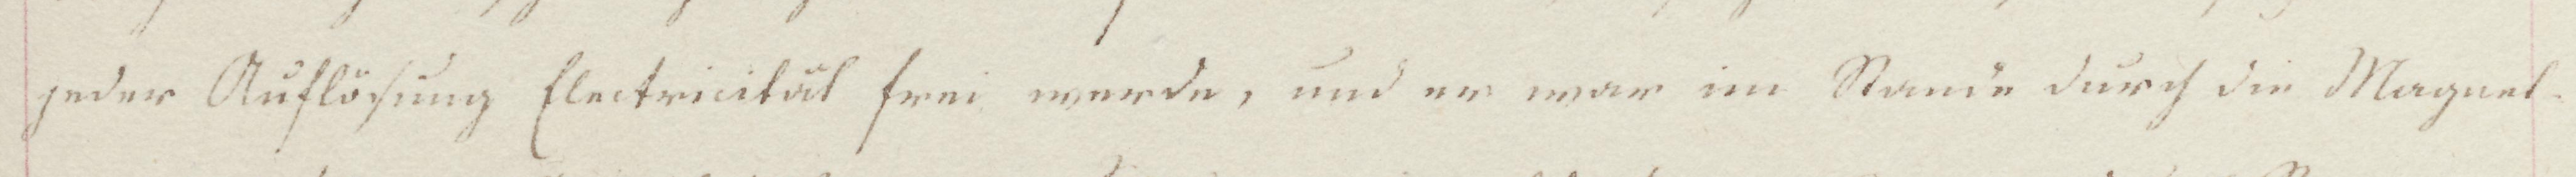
jeder Auflösung Electricität frei werde, und er war im Stande durch die Magnet-
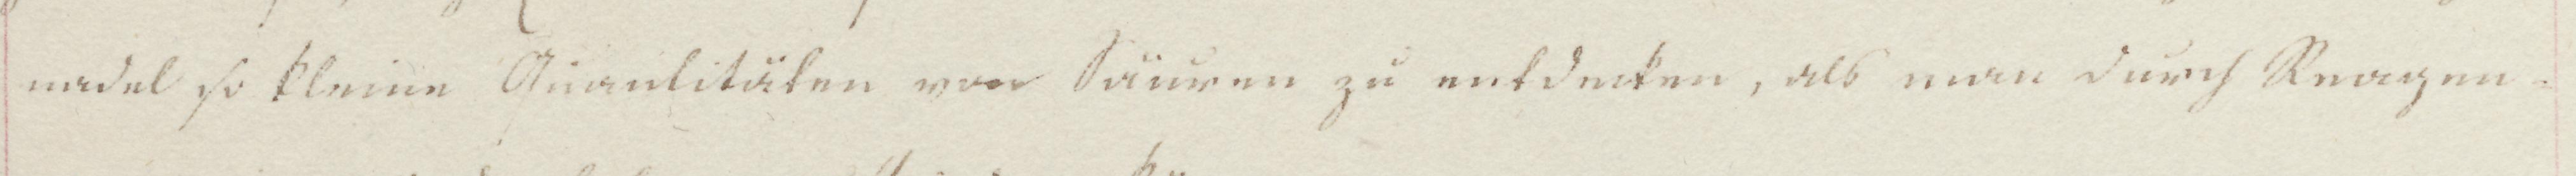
nadel so kleine Quantitäten von Säuren zu entdecken, als man durch Reagen-
